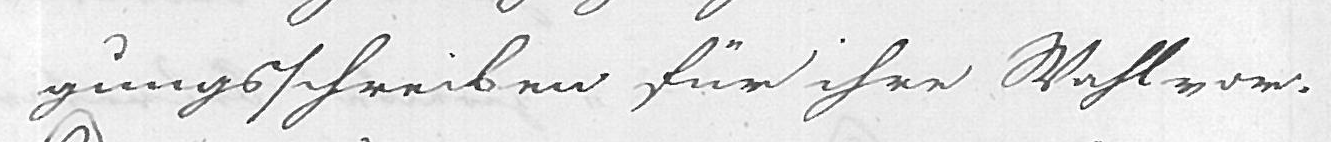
gungschreiben für ihre Wahl vor.
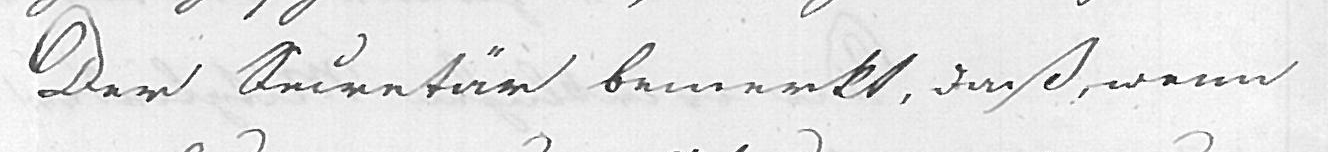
Der Secretär bemerkt, daß, wenn
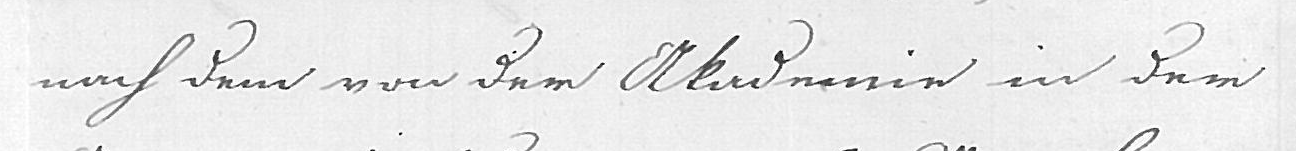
nach dem von der Akademie in der
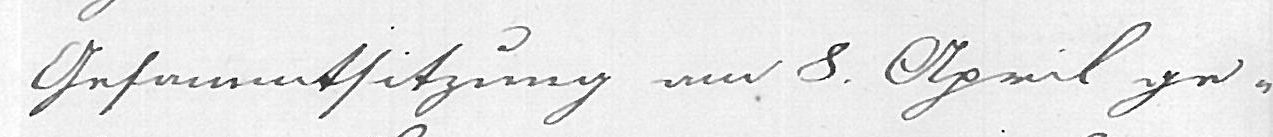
Gesammtsitzung an 8. April ge-
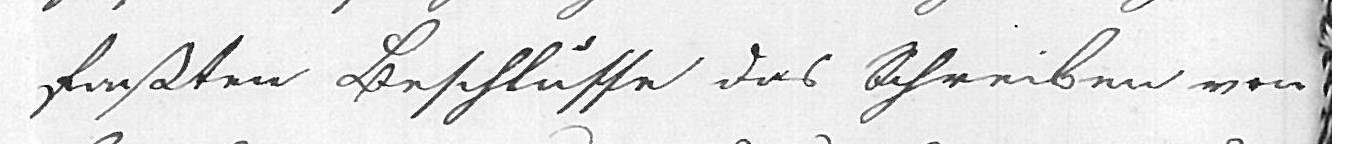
faßten Beschlusse das Schreiben von
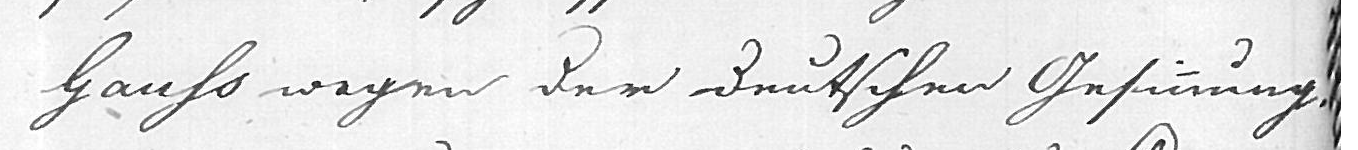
Gauss wegen der deutschen Gesinnung,
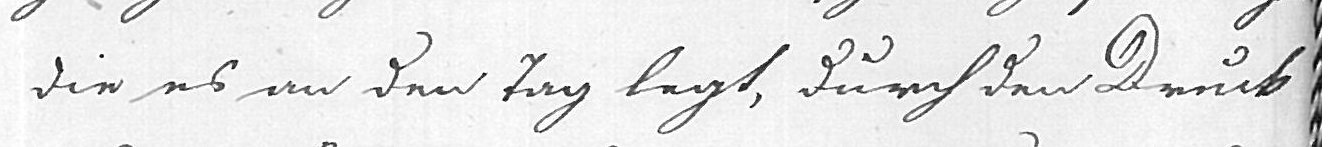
die es an den Tag legt durch den Druck
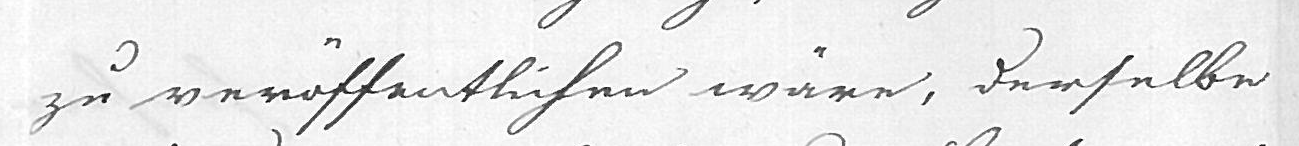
zu veröffentlichen wäre, derselben
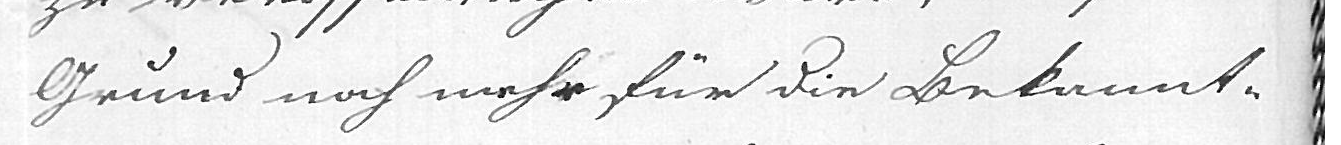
Grund noch mehr für die Bekannt-
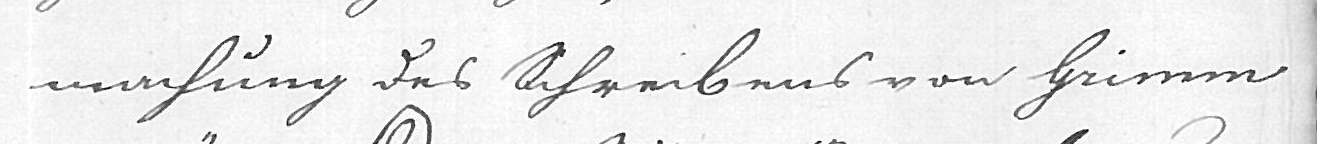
machung des Schreibens von Grimm
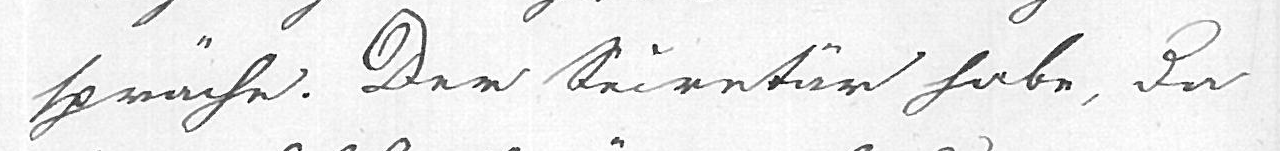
spräche. Der Secretär habe, da
